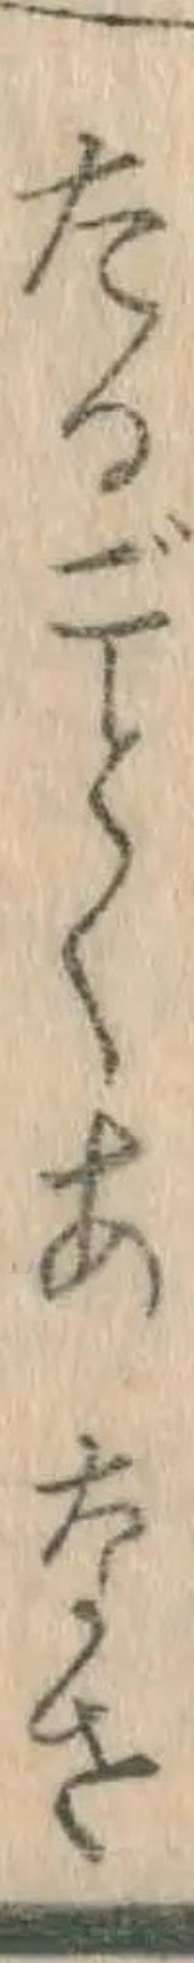たるごとくあなを
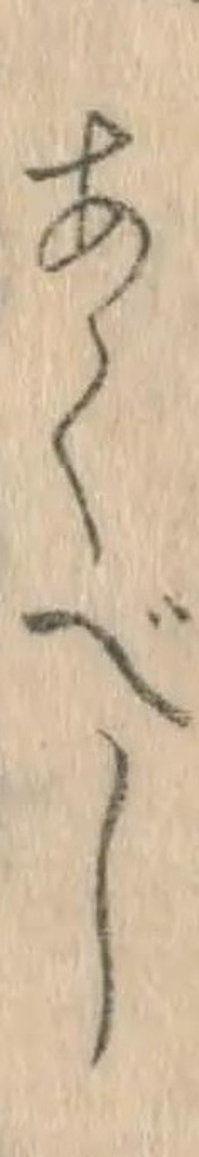あくべし
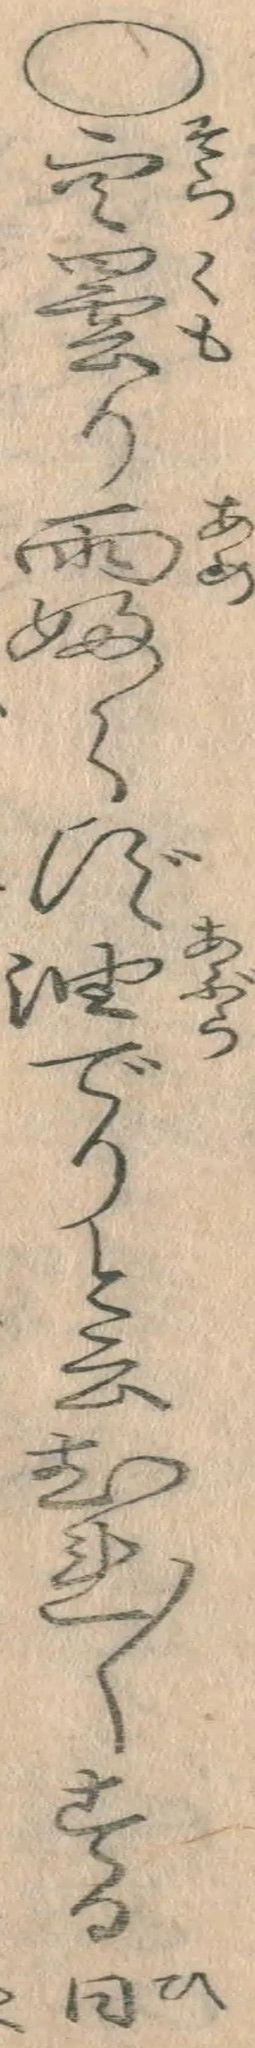○空曇り雨ふらず油でりと云むれ〳〵する日
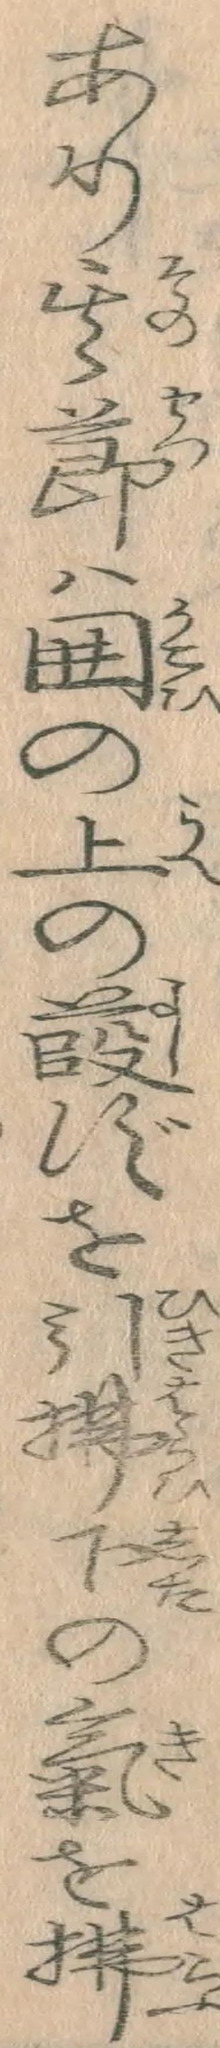あめ其節は囲の上の葭ずを引揚下の気を払
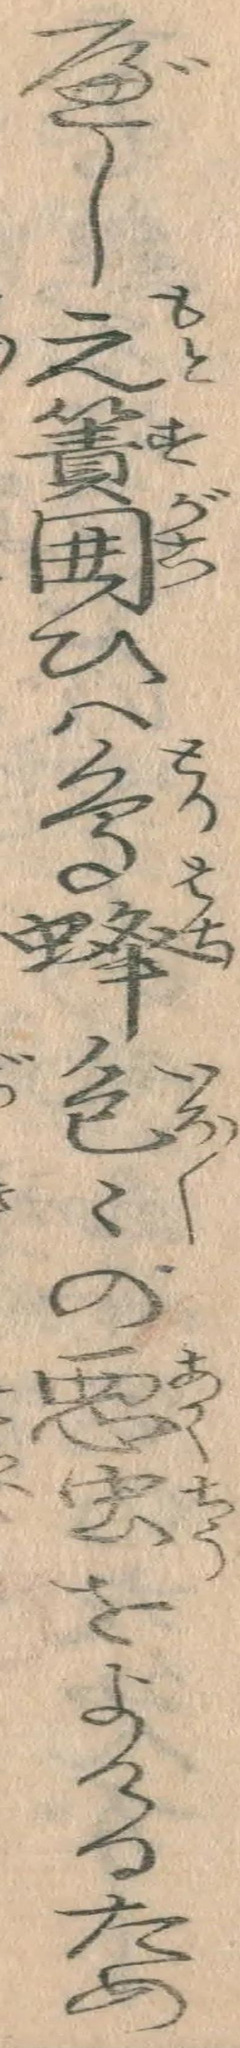べし元簀囲ひは鳥蜂色々の悪虫をよけるため
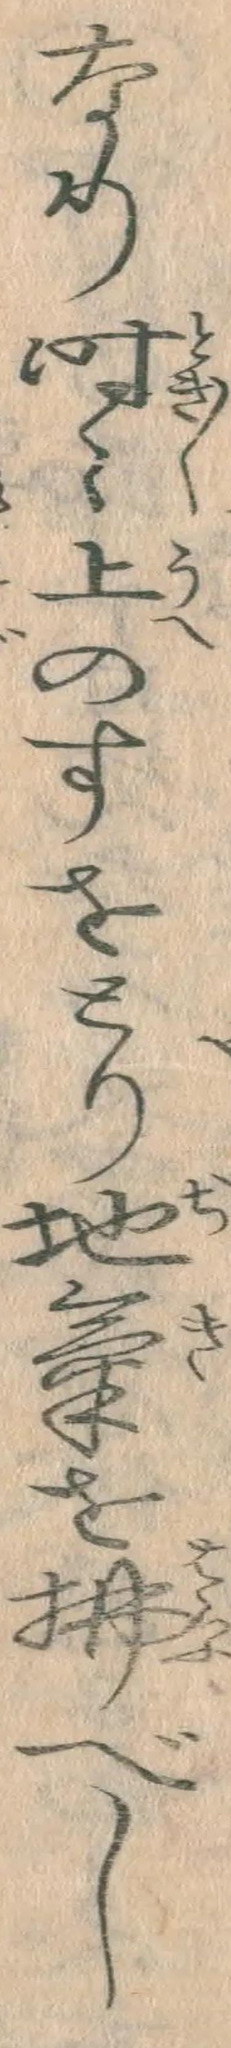なり時々上のすをとり地気を払べし
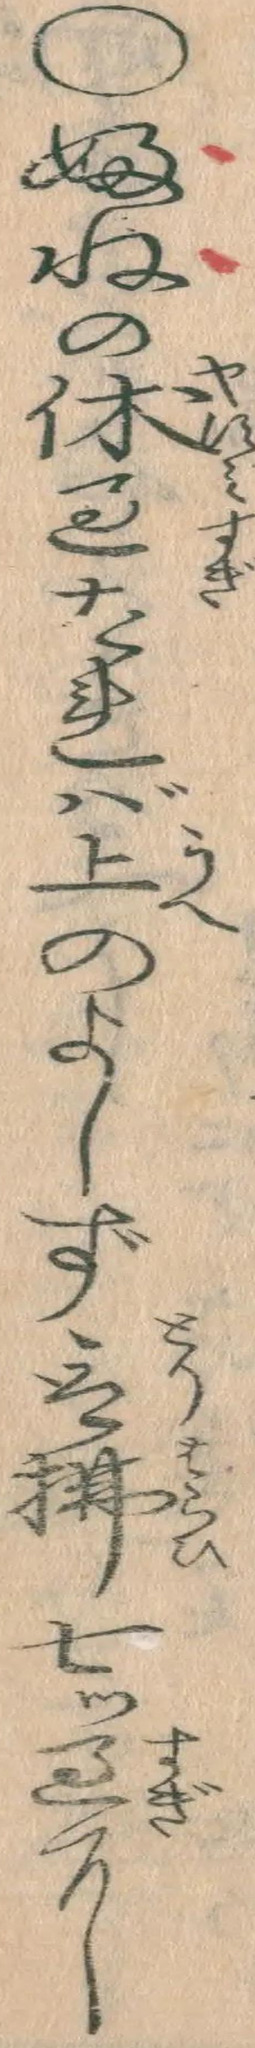○ふねの休過たれば上のよしず取払七ツ過に
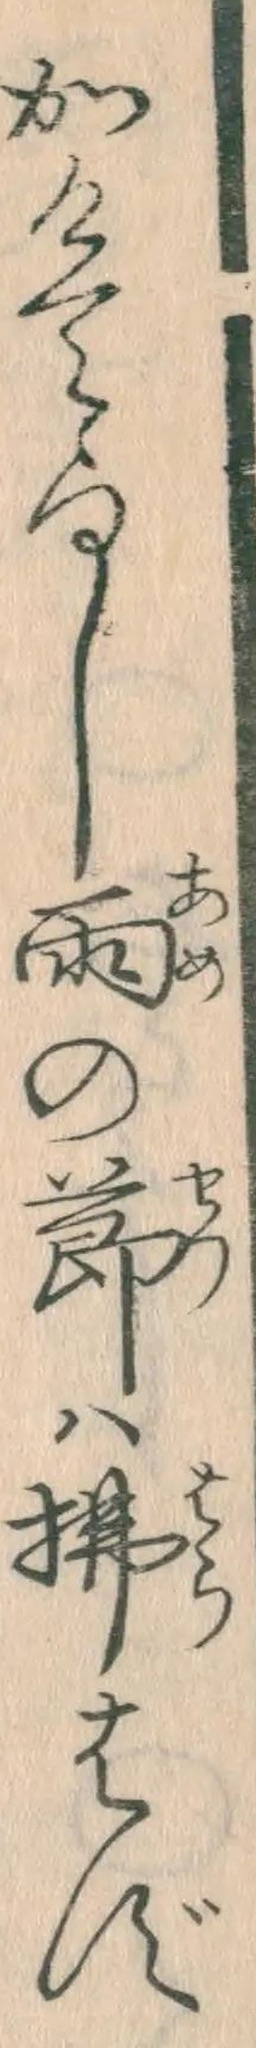かけてよし雨の節は払はず
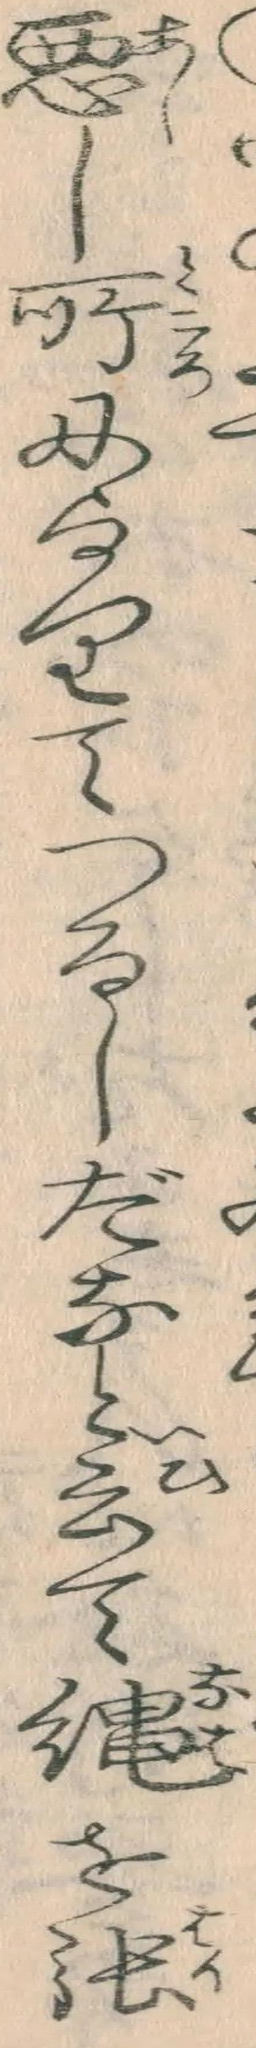悪し所によりてつるしだなと云て縄を張
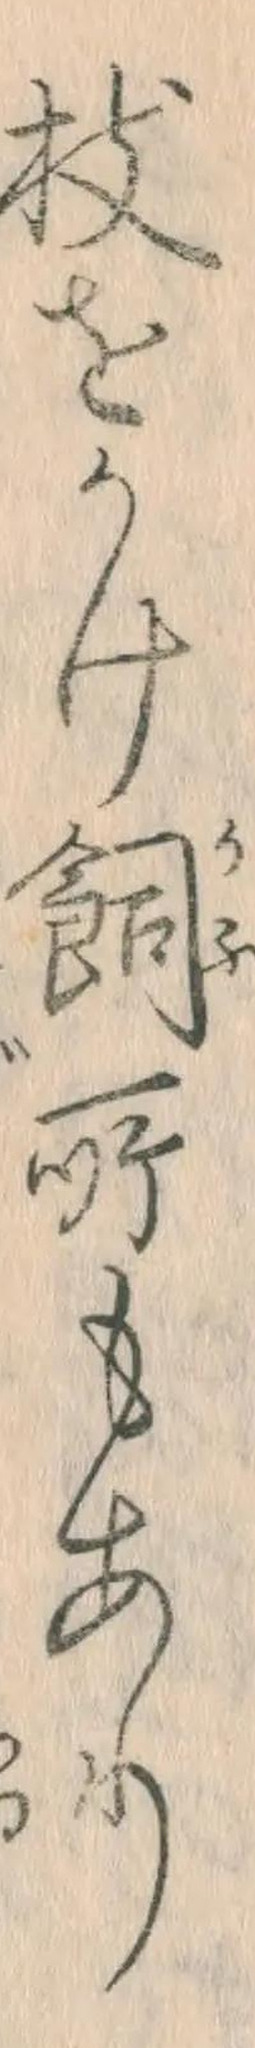枝をかけ飼所もあり
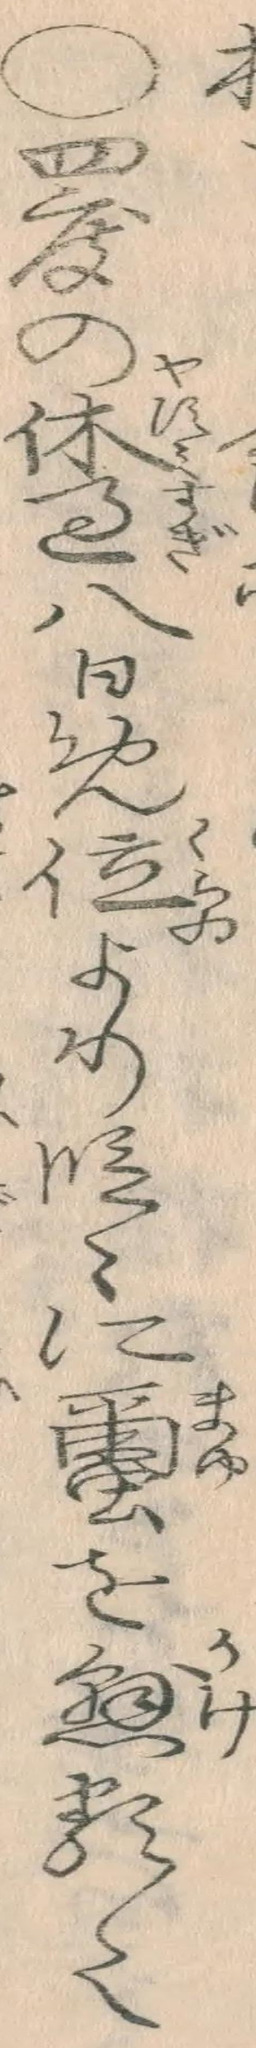○四度の休過八日め位より段々に繭を懸る也
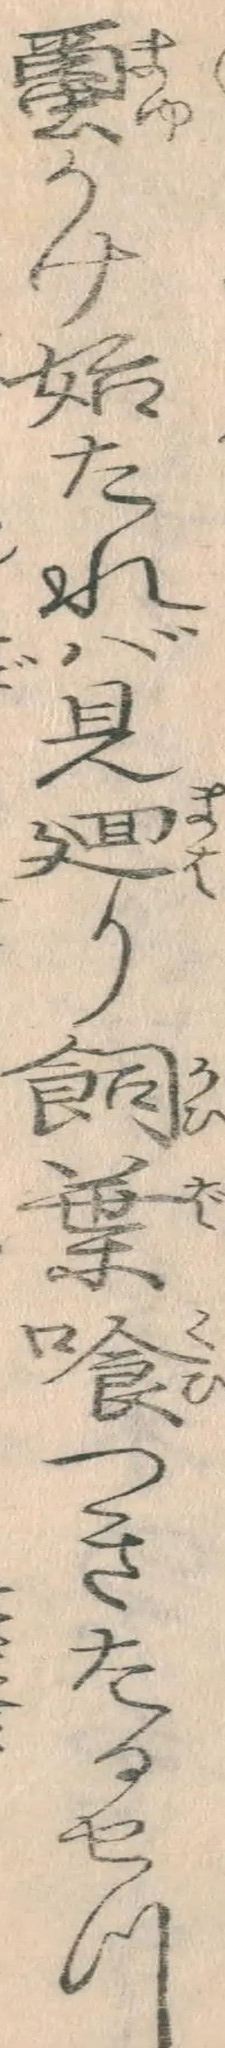繭かけ始たれば見廻り飼葉喰つきたるせつ
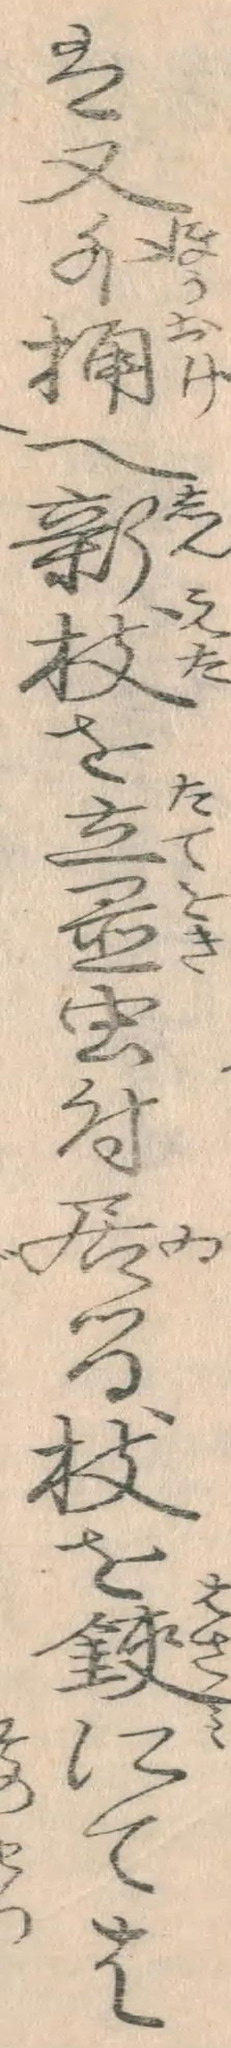は又外桶へ新枝を立置虫付居る枝を鋏にては
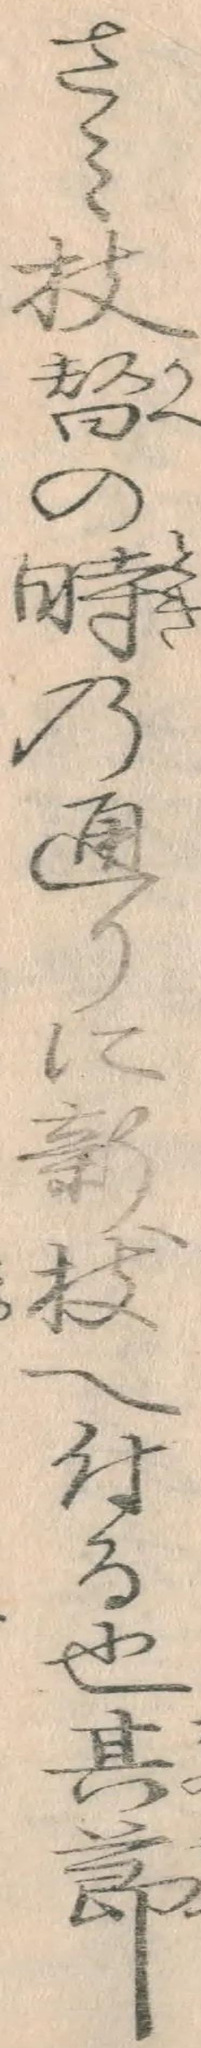さみ枝替の時の通りに新枝へ付る也其節
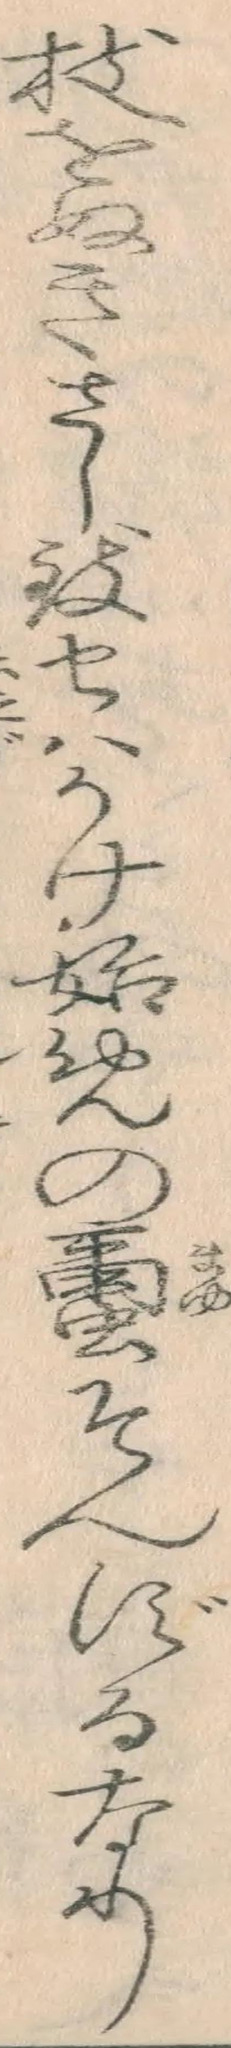枝をぬきさし致せはかけ始めの繭そんずるなり
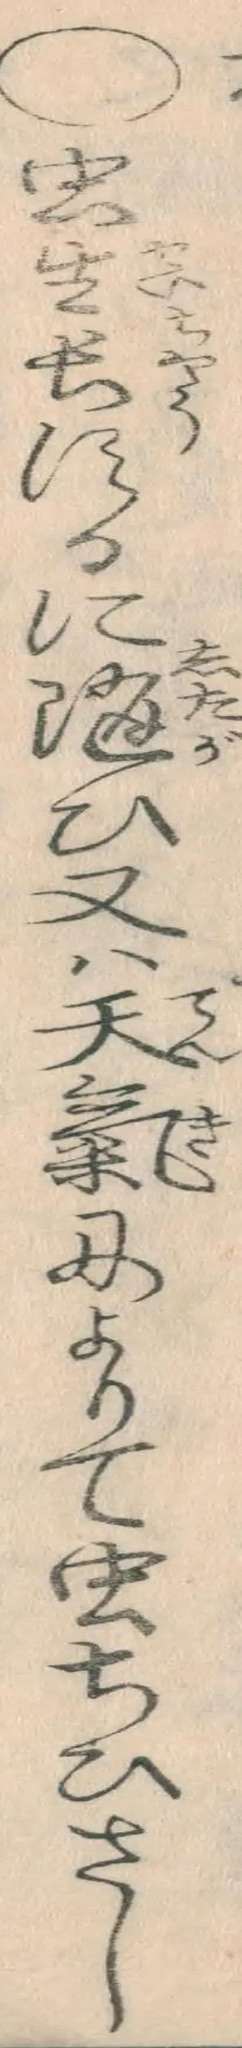○虫生長するに随ひ又は天気によりて虫ちひさし
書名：山繭養法秘傳抄
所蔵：国立国会図書館 National Diet Library, JAPAN
